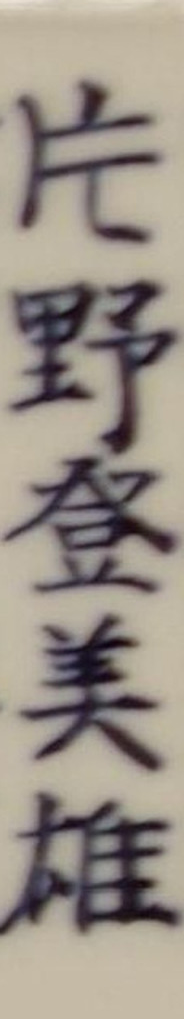片野登美雄
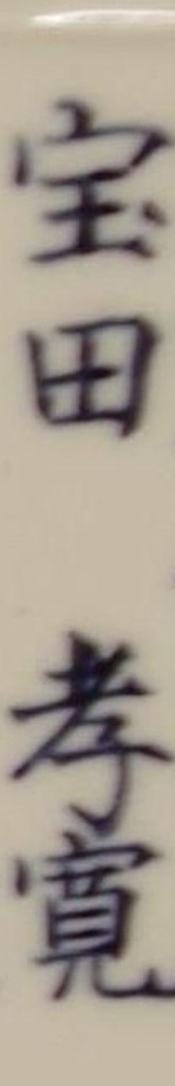宝田孝寛
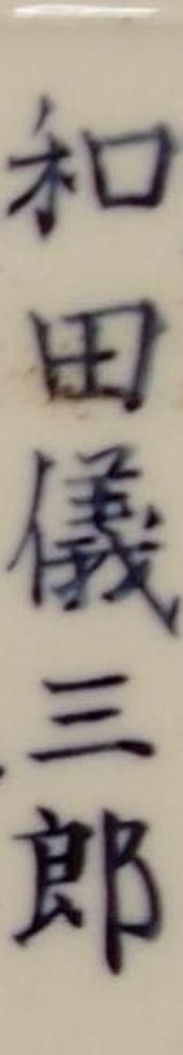和田儀三郎
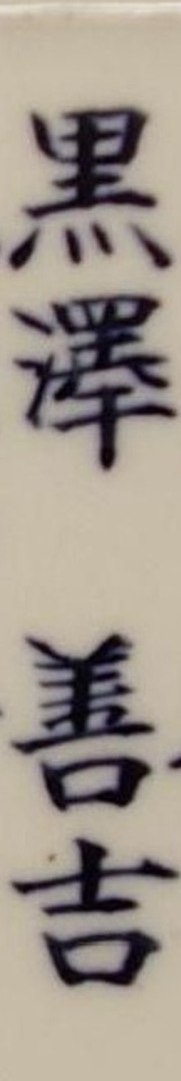黒澤善吉
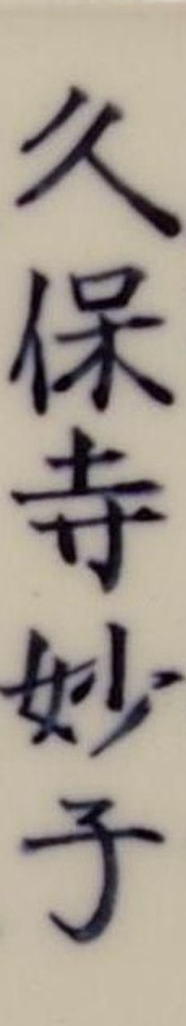久保寺妙子
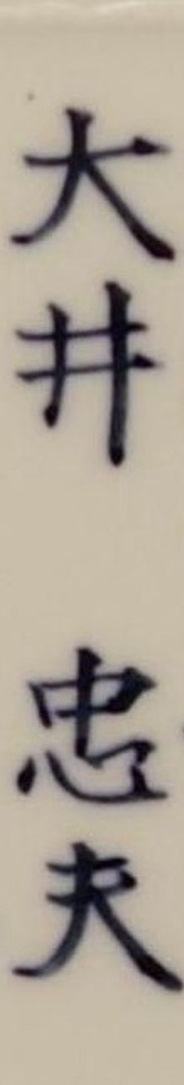大井忠夫
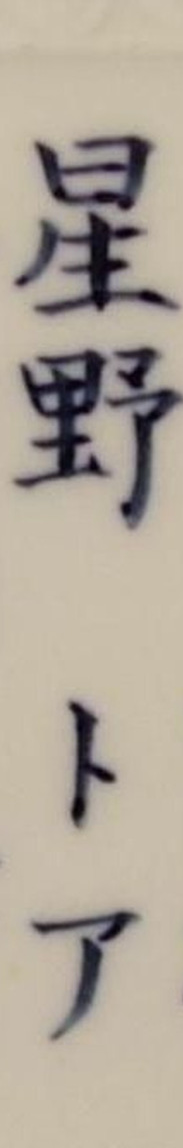星野トア
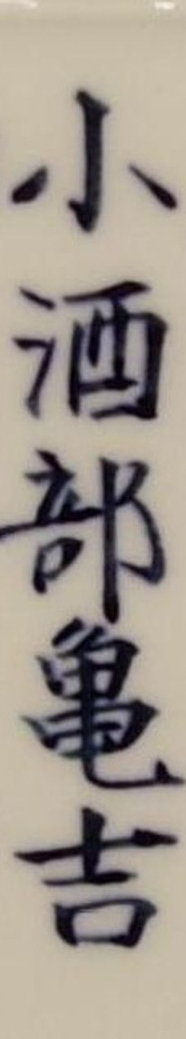小酒部亀吉
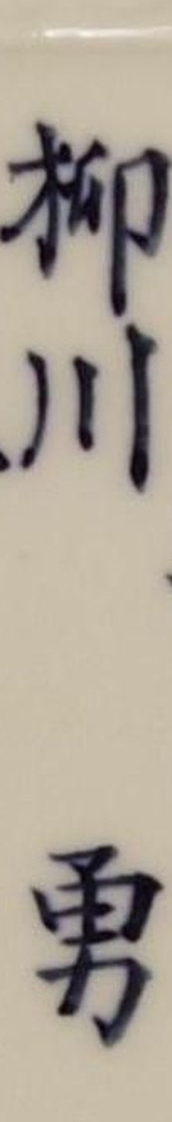柳川勇
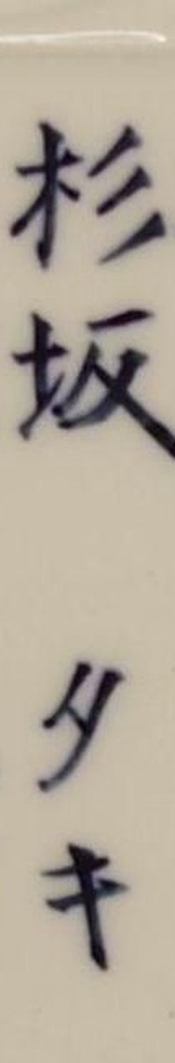杉坂タキ
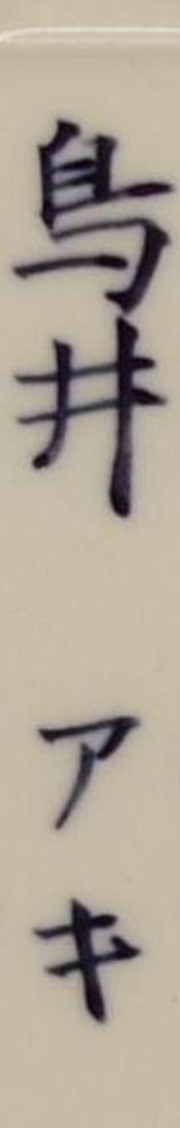鳥井アキ
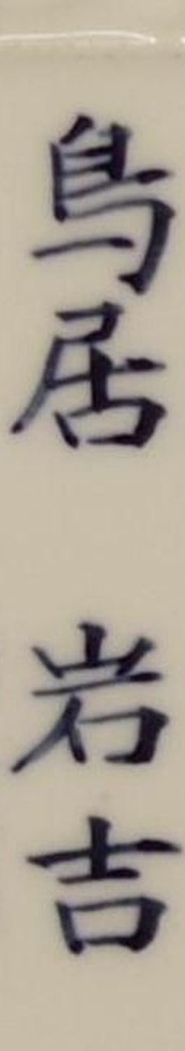鳥居岩吉
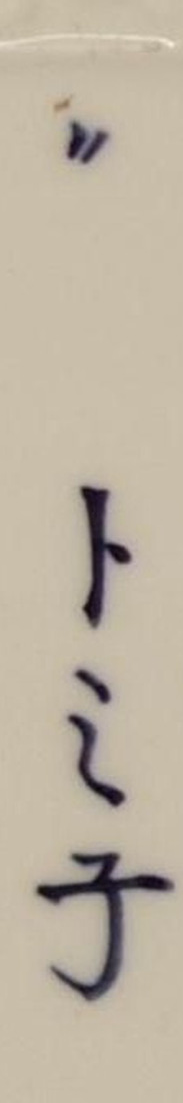トミ子
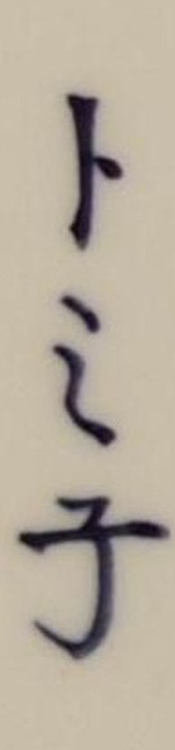トミ子
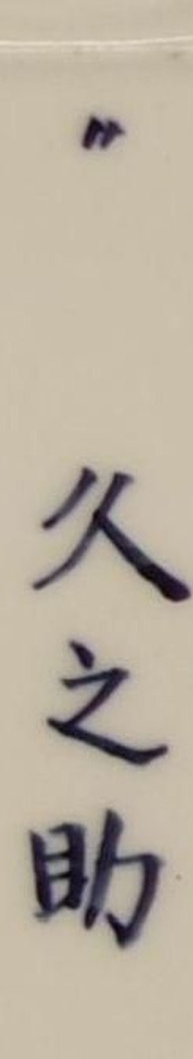久之助
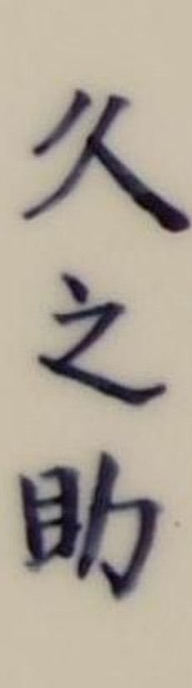久之助
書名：M~S
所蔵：高野山金剛峯寺
